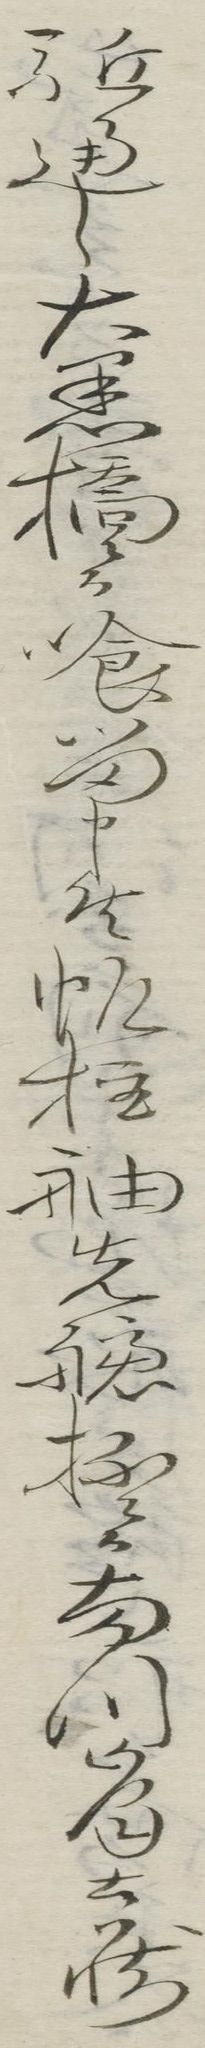駈通し大黒橋ニ而喰留申候帆柱舳先艫抔ニ而両川岸土蔵
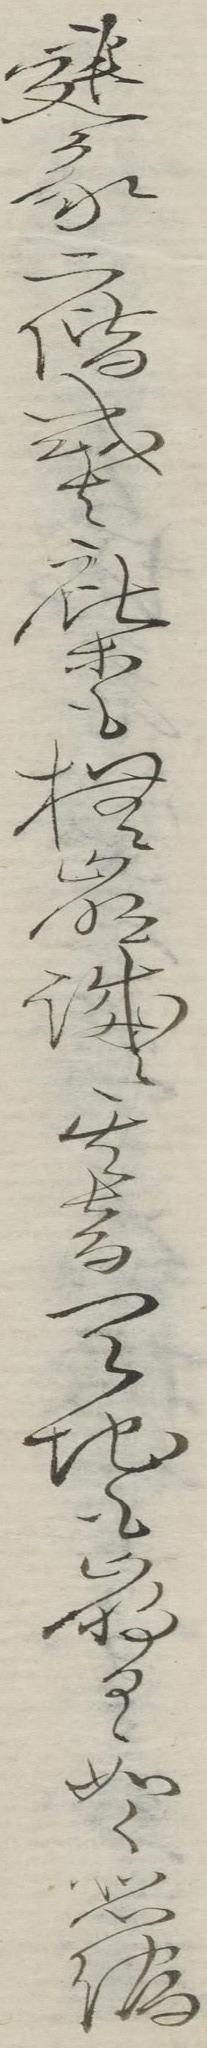建屋二階或は庇等も撫崩誠ニ其音天地も崩るゝ如く恐縮

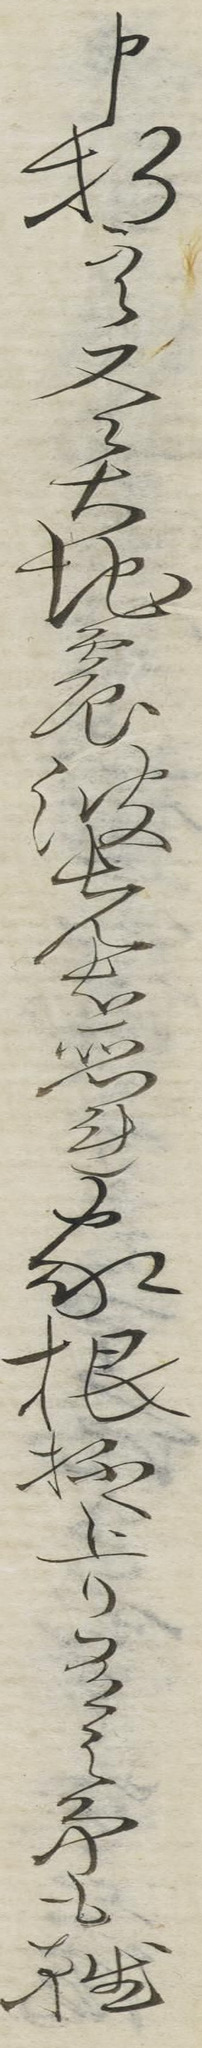申折から又々大地震波先を恐れ家根抔へ上り有之事も難
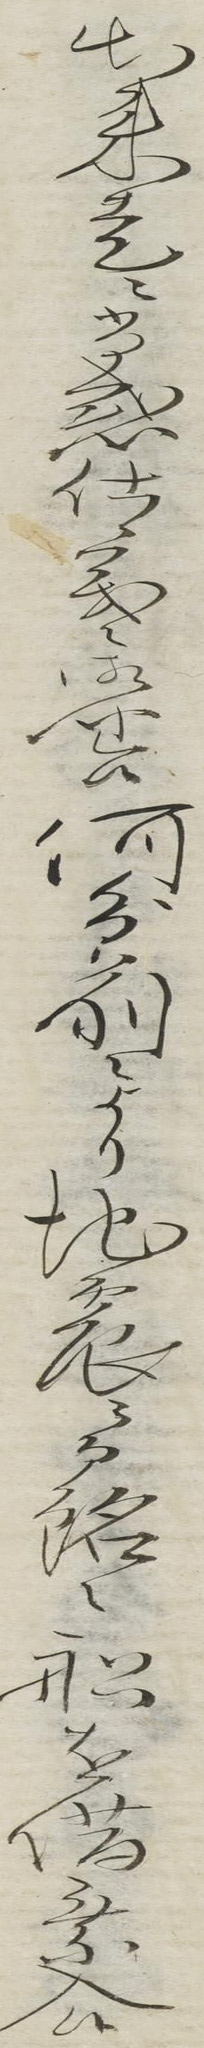出来是ニ当惑仕候義ニ御座候何分前々より地震ニ而銘々船を借乗入候
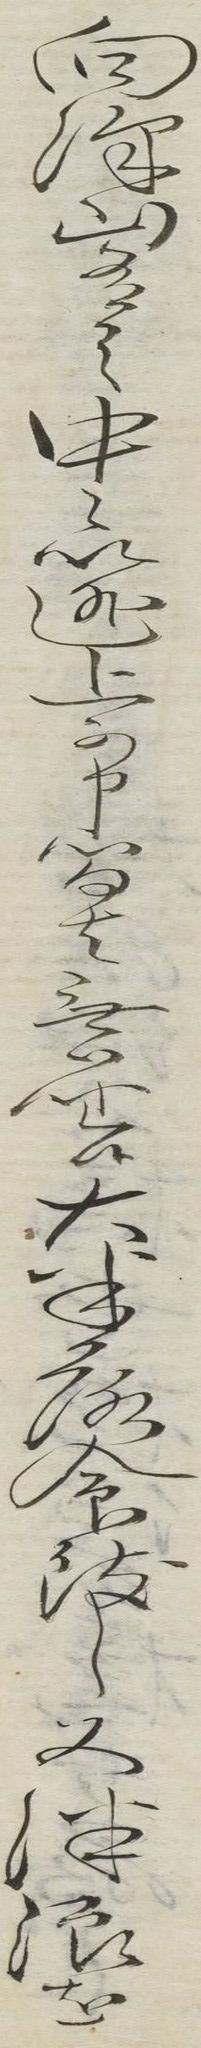向深山有之中々以逃上可申間は無御座候大半落命致し又津浪を
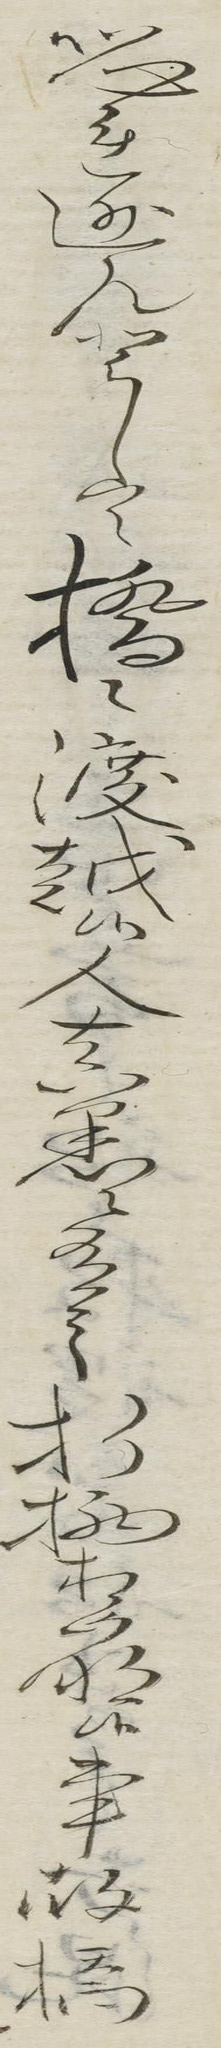恐れ逃んとして橋ニ渡越候人真黒ニ有之折柄相崩候事故橋
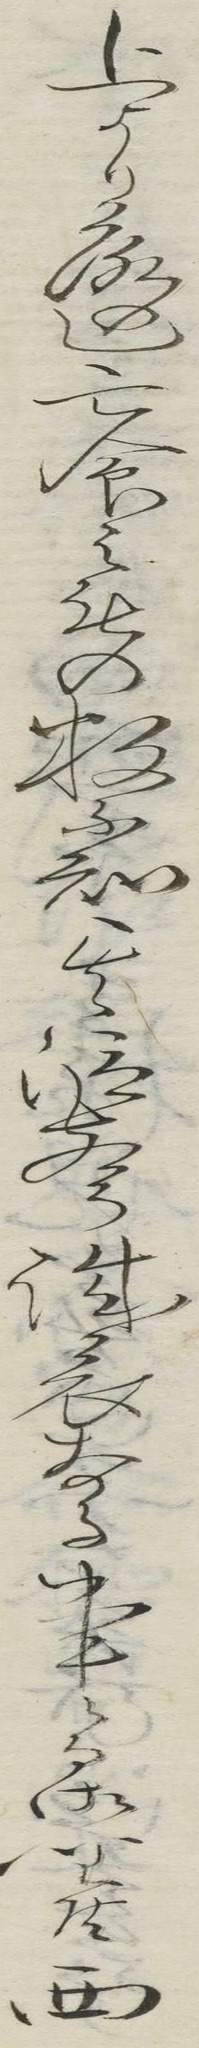上より落込亡命之もの数不知其泣声誠哀なる事ニ而御座候西
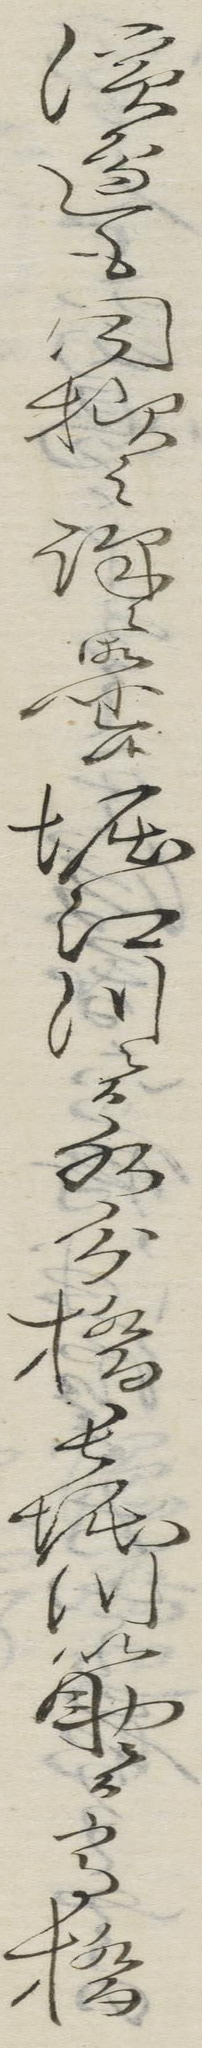浜辺も同様之訳ニ御座候堀江川ニ而水分橋長堀川筋ニ而高橋
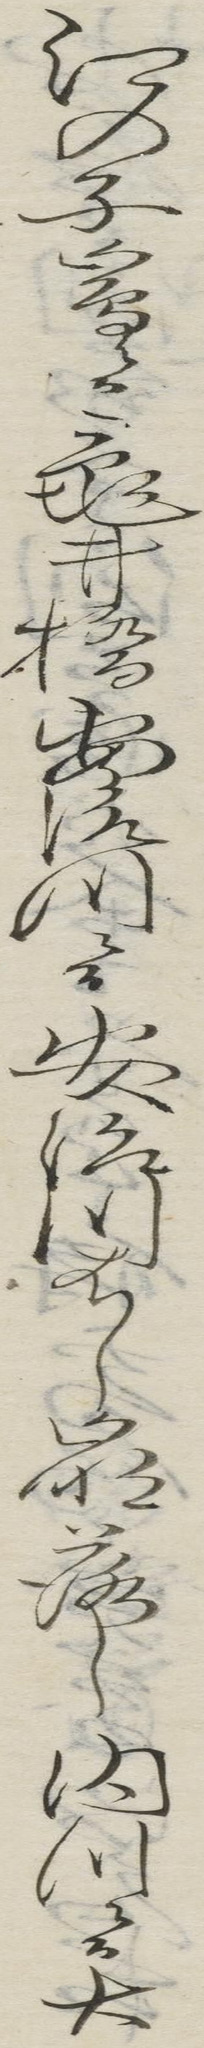江の子嶌ニ而亀井橋安治川ニ而安治川はし崩落し内川ニ而大
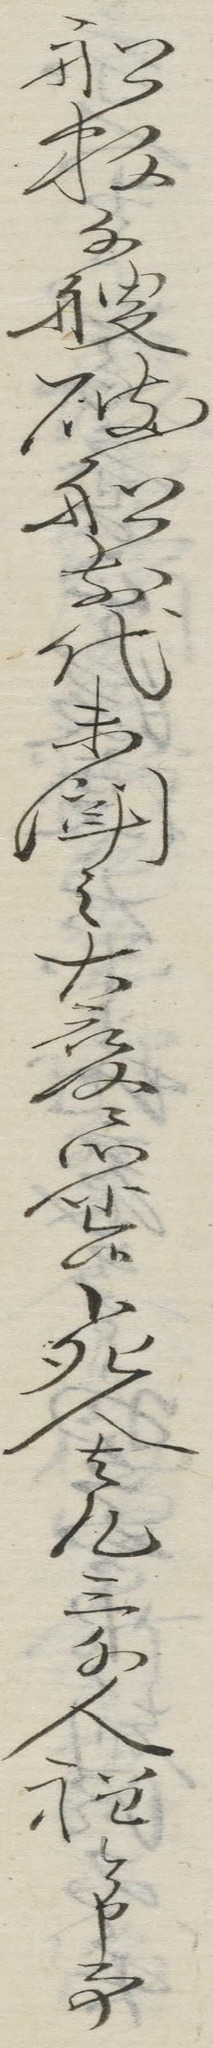船数千艘破船前代未聞の大変に御座候死人は凡三千人程と申事
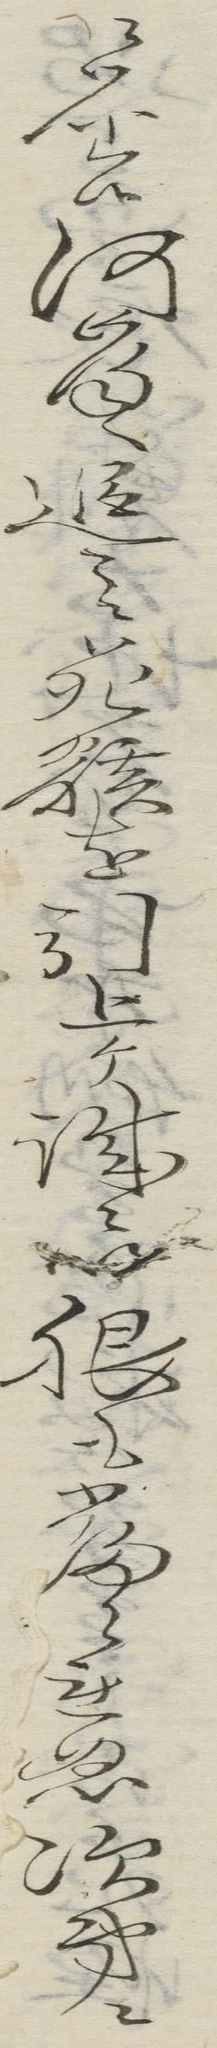ニ御座候河岸へ追々ニ死骸を引上ケ誠ニ以眼も当てられぬ次第ニ
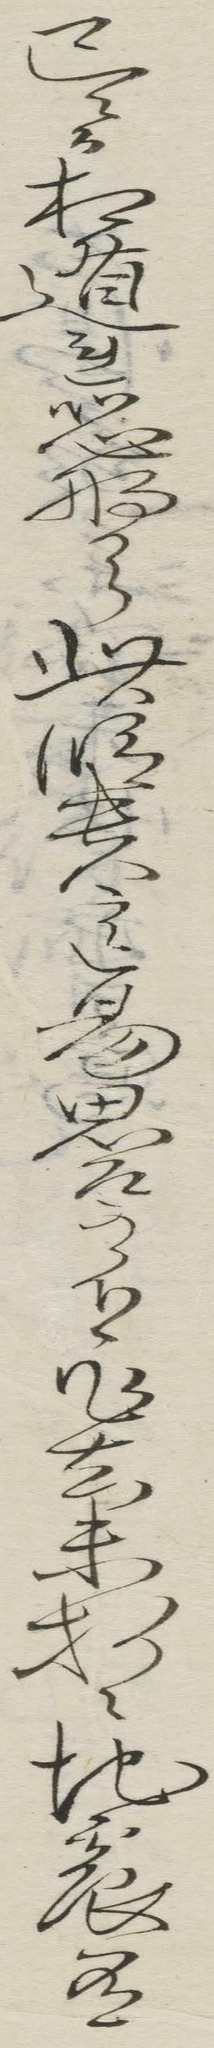已ニ而相遁れ恐なから此段貴意易思召可被下候乍去未折々地震有
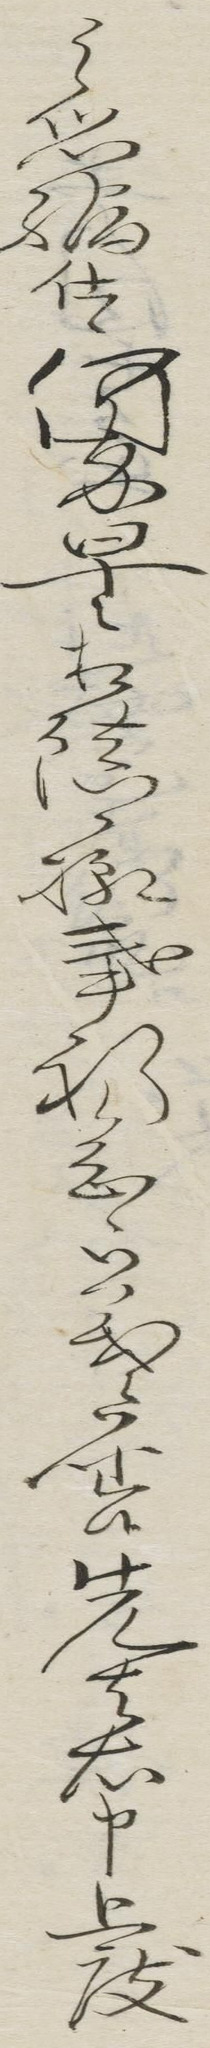之恐縮仕候何卒早々相鎮候様奉祈念候御義ニ御座候先は右申上度
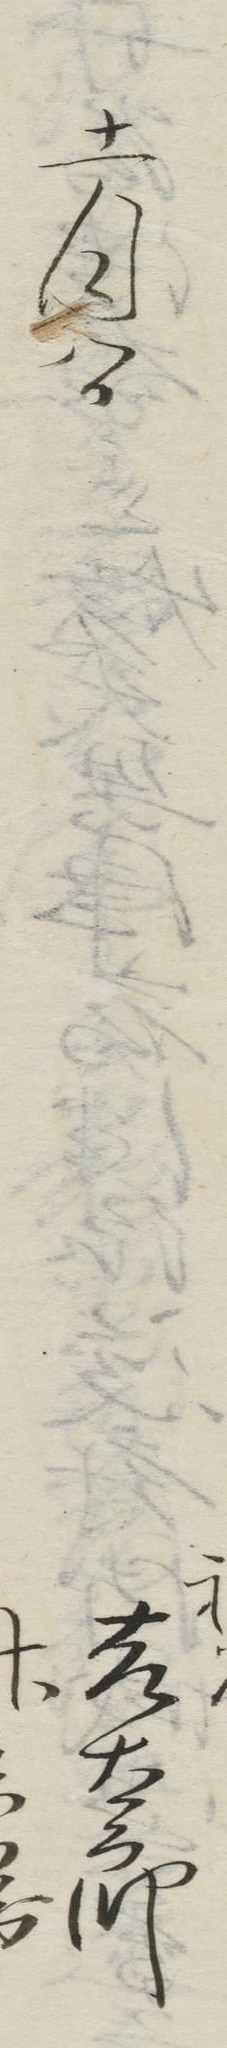十一月八日袴屋
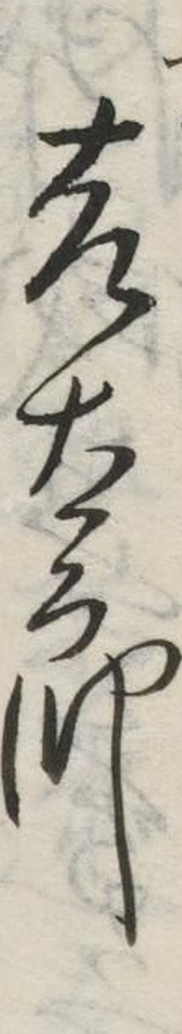吉太郎
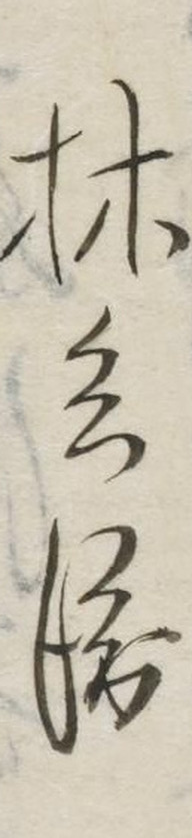林兵衛
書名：大地震實録
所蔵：東京大学地震研究所図書室 Earthquake Research Institute Library, The University of Tokyo, JAPAN
